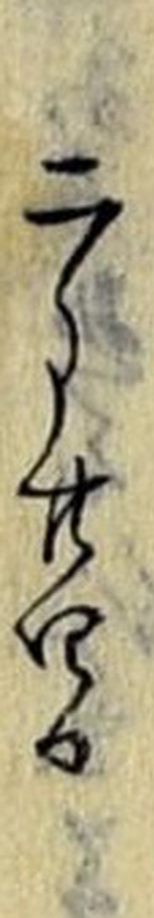二月廿四日
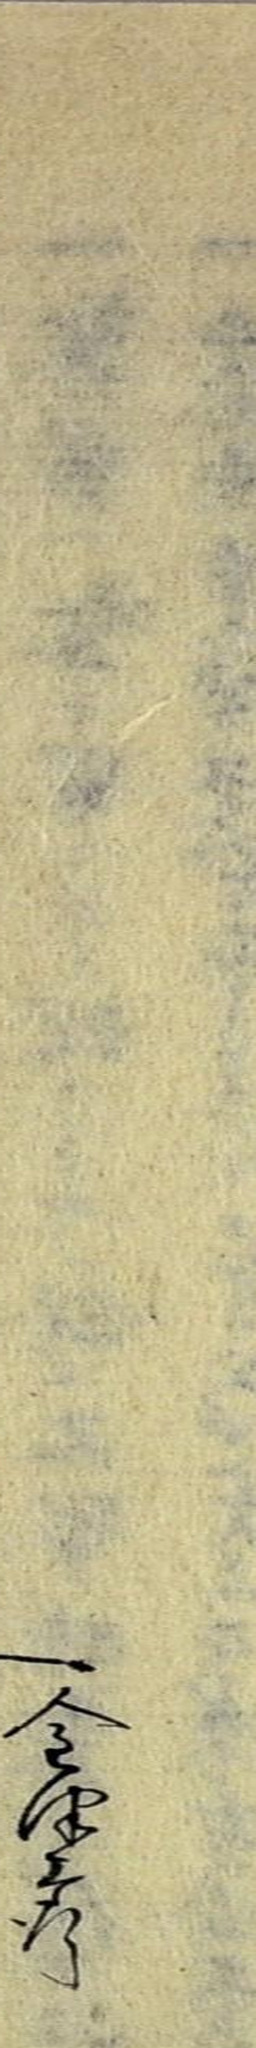金津奉行
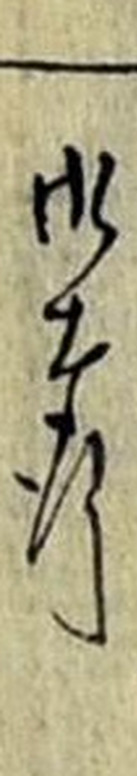御奉行
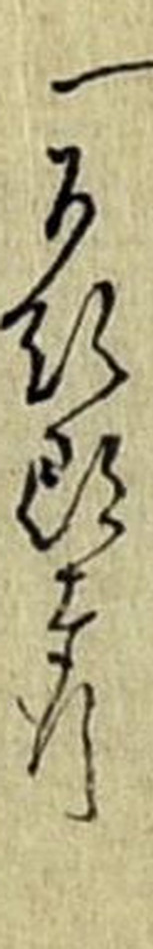下領郡奉行
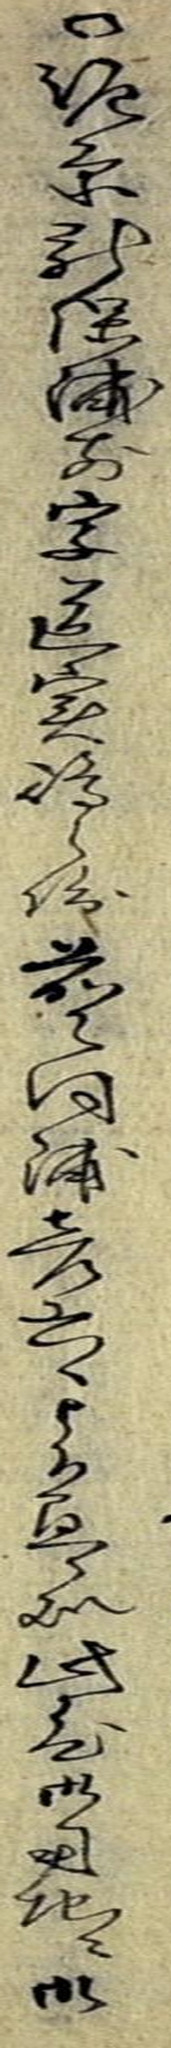○泥原新保浦前字道実嶋之儀前々同浦彦六へ下置候処此度御用地に御
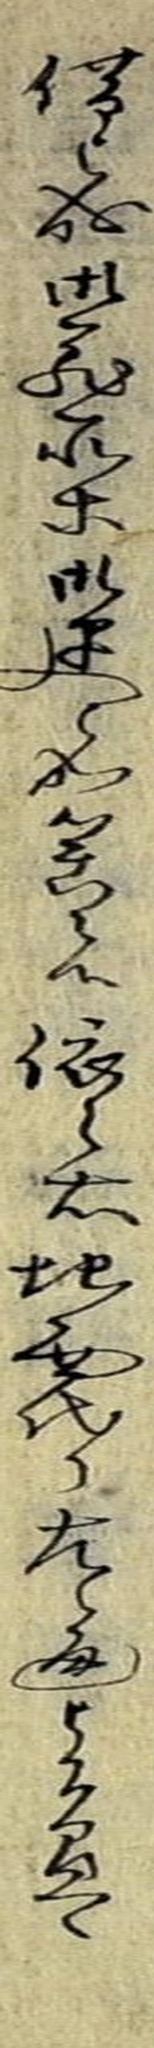借被成御蔵所等御建被成筈に候依之右地面代り左之通被下置候
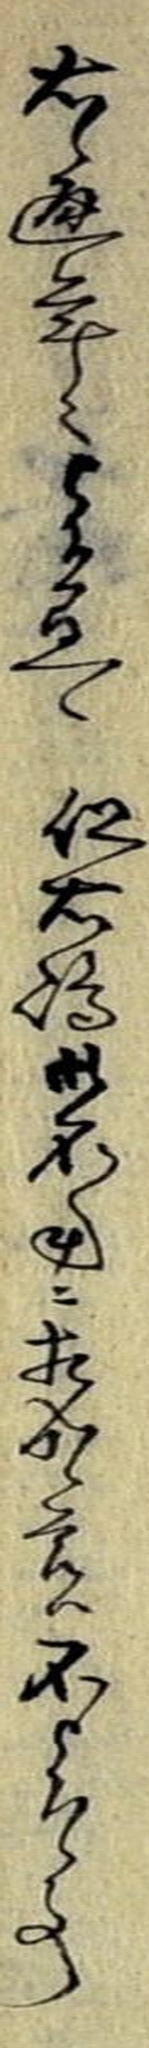右之通年々被下置候但右嶋御不用に相成候節は不被下候事
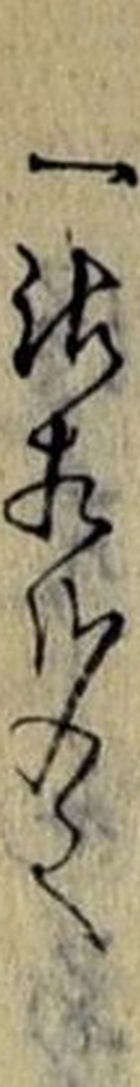一銀拾弐匁
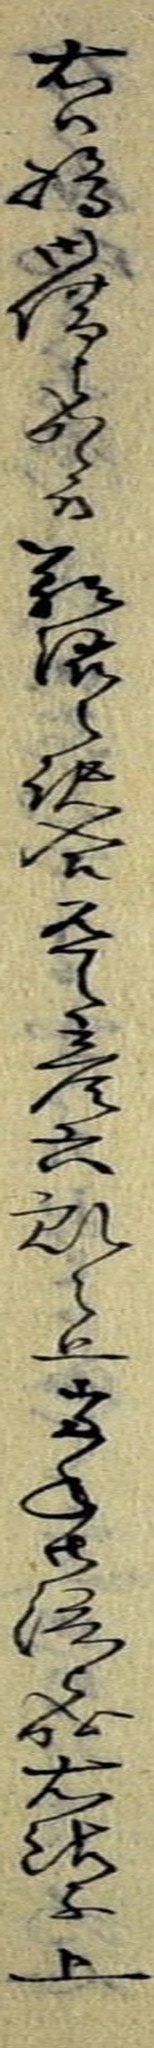右は嶋御借被成候に付難渋之訳合有之彦六願之上当年御渡被成右銀子上
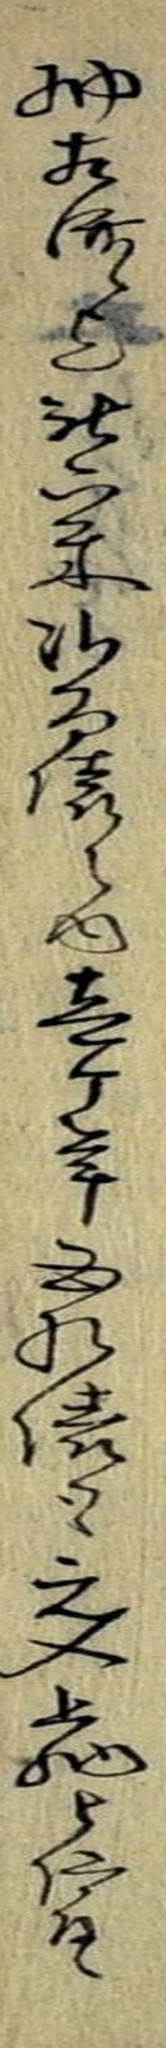納相済候迄被下米弐百俵之内壱ヶ年五拾俵つヽ元〆上納被仰付候
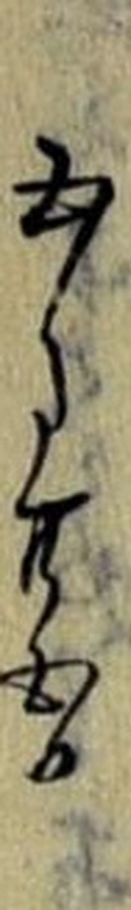五月廿五日
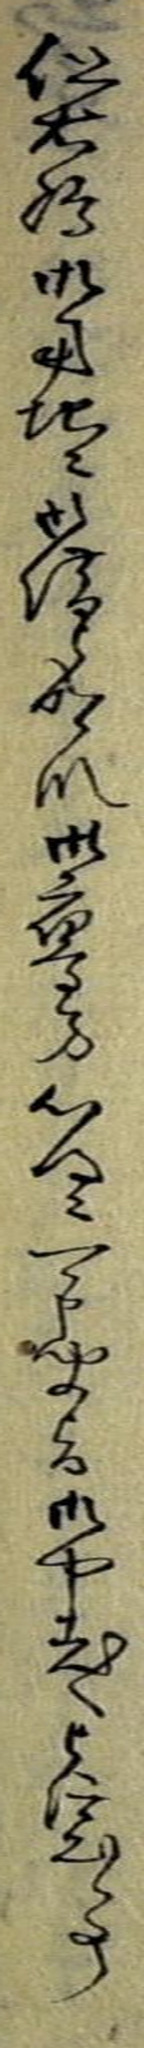但右嶋御用地に御借被成候段御鷹方心得に可申聞旨御中老へ被仰出候事
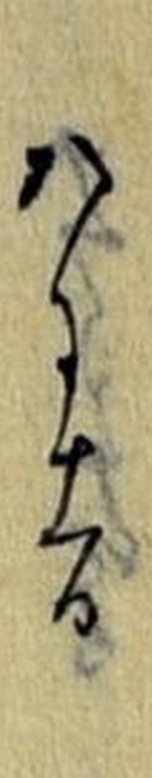八月十一日
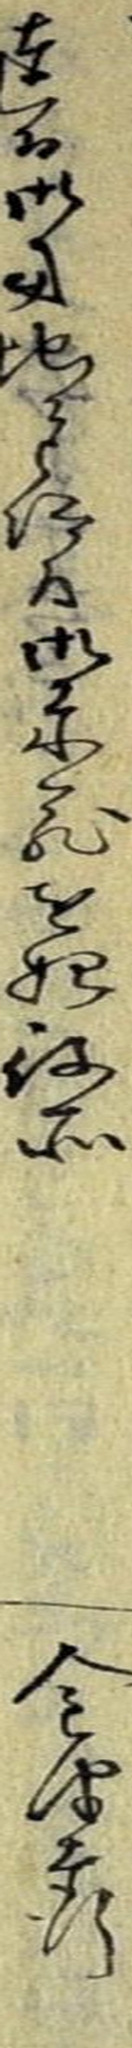達而御用地に被仰付御米蔵を始役所金津奉行
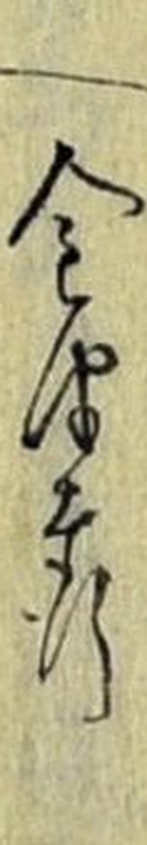金津奉行
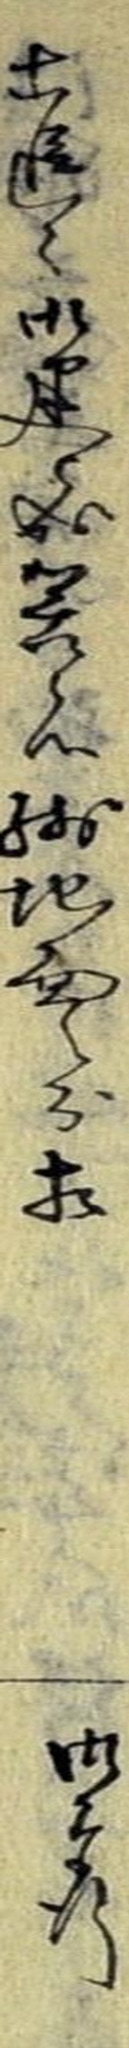等追々御建被成筈に候残地面之分相御奉行
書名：命令之部 四
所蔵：福井県文書館 Fukui Prefectural Archives
